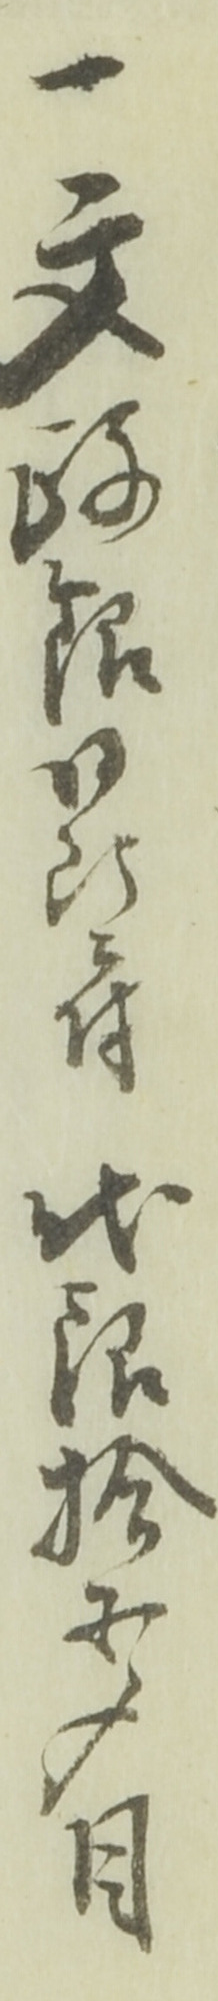一文政銀同断ニ付代銀拾五〆目
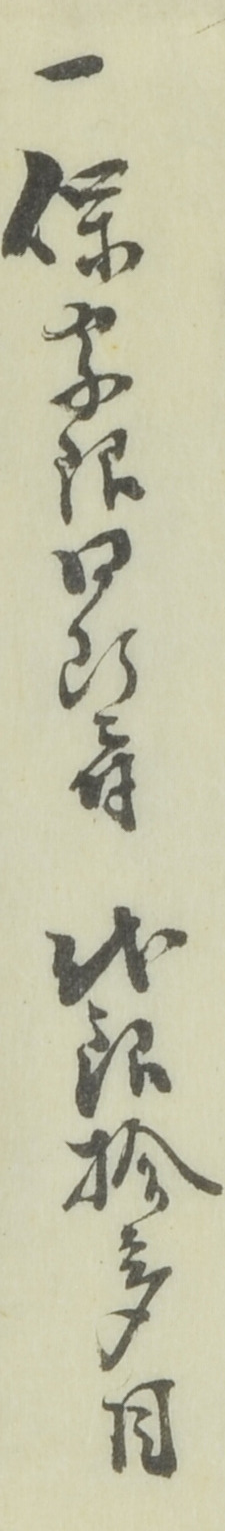一保字銀同断ニ付代銀拾壱〆目

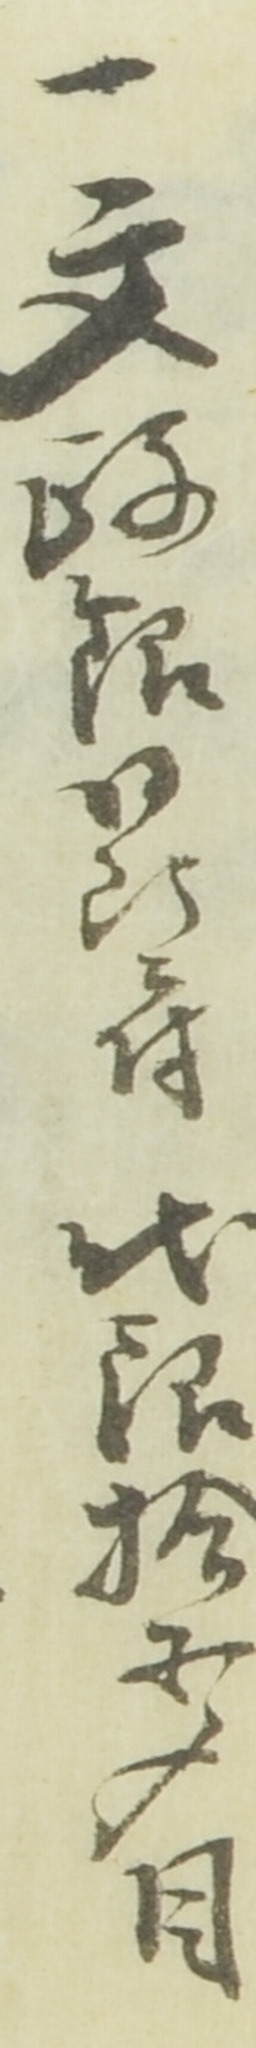一文政弐朱銀同断ニ付代金百拾五両
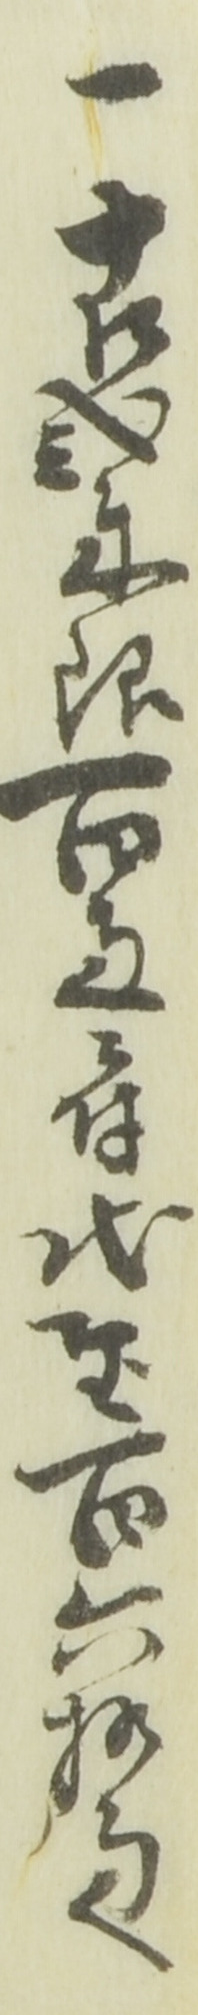一古弐朱銀百両ニ付代金百六拾両
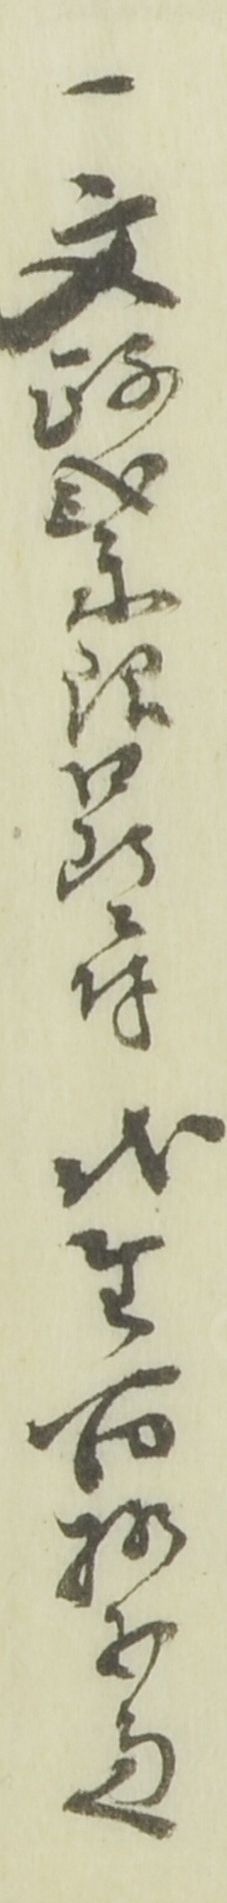一文政弐朱銀同断ニ付代金百拾五両
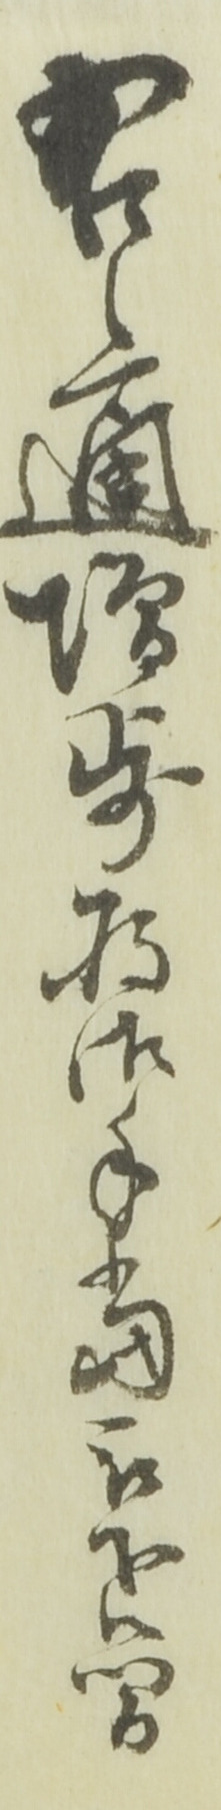右之通増歩為御手当被下候間
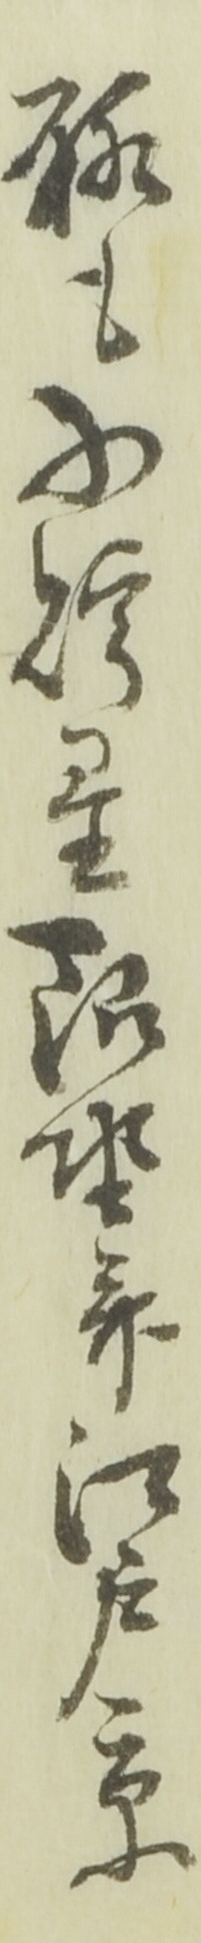聊も不貯置銀座幷江戸京
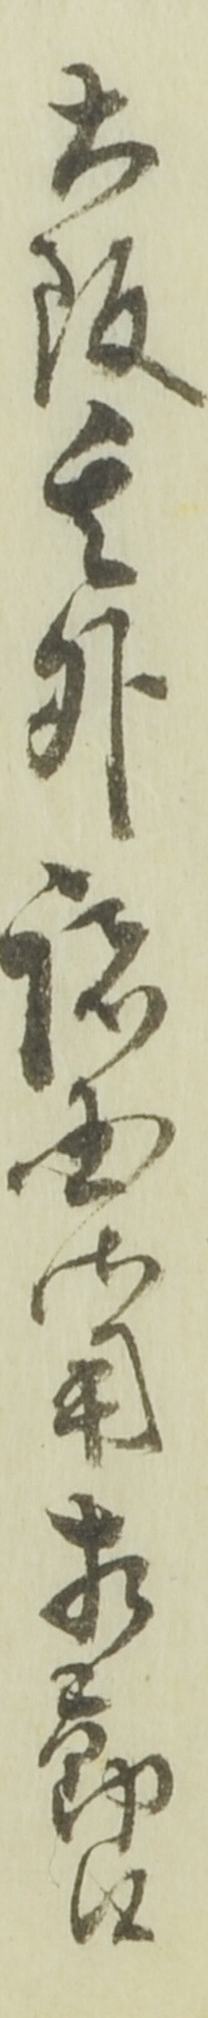大阪其外諸国御用相勤候
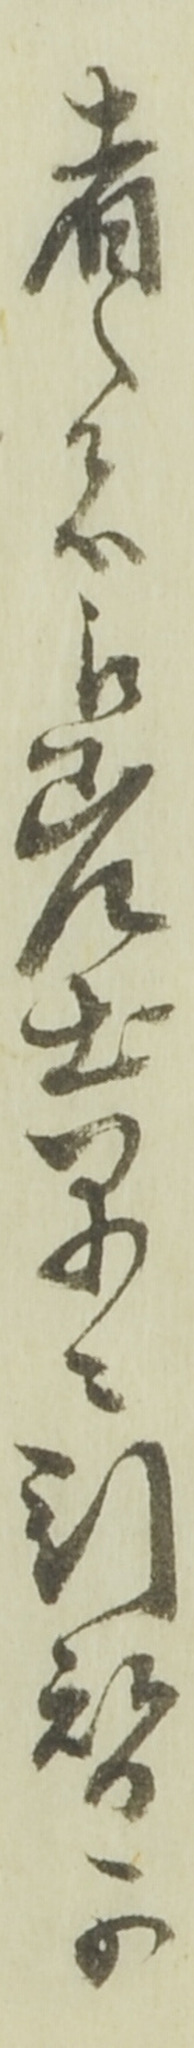者之者江差出早々引替可
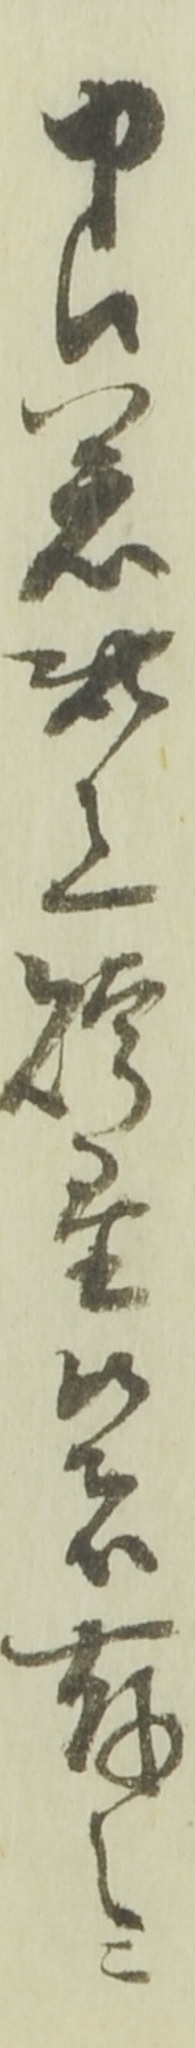申候若此上貯置候者存之ニ
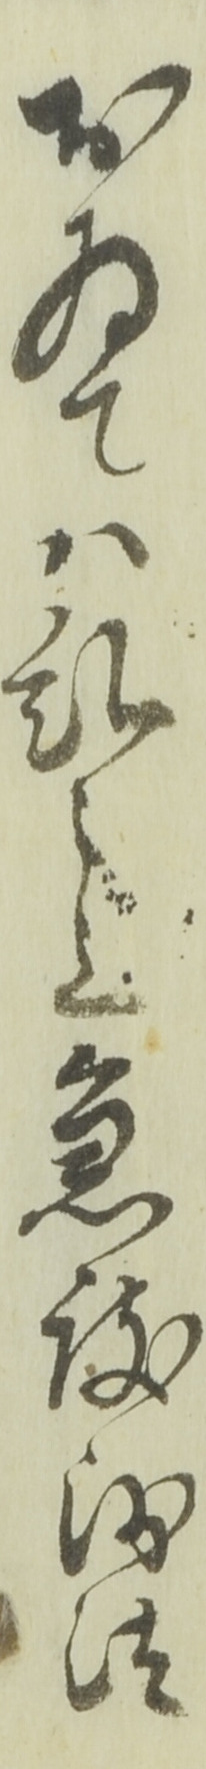おゐてハ糺之上急度沙汰
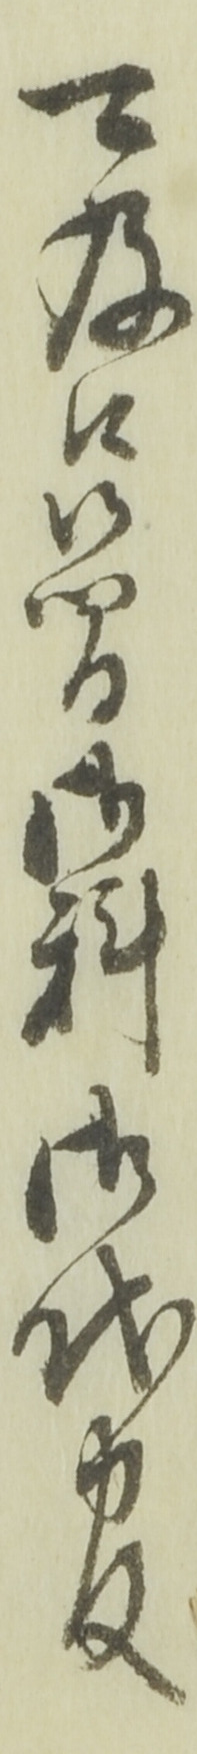可及候候間御料御代官
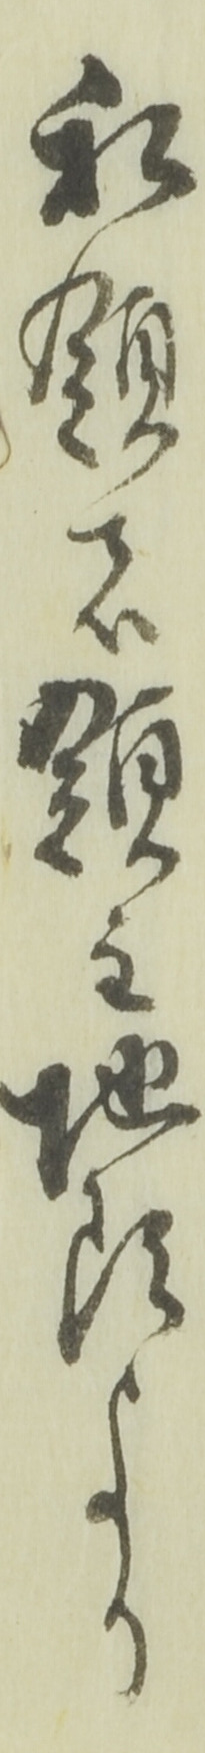私領者領主地頭より
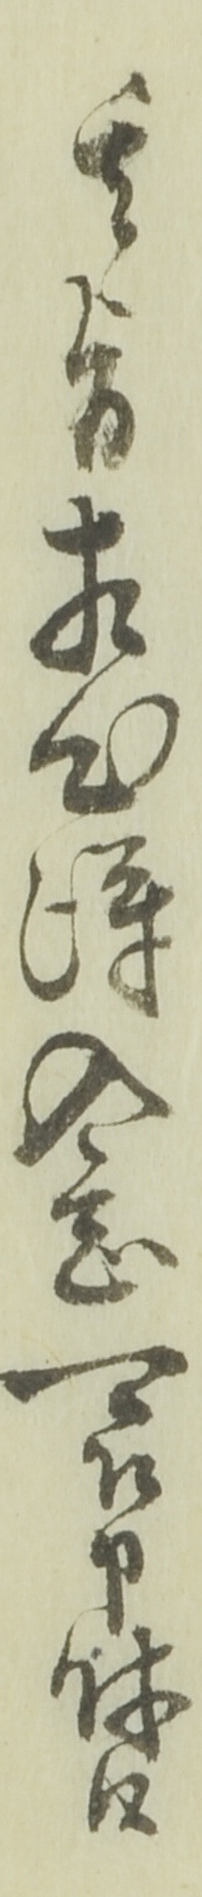其旨相心得入念可被申付候
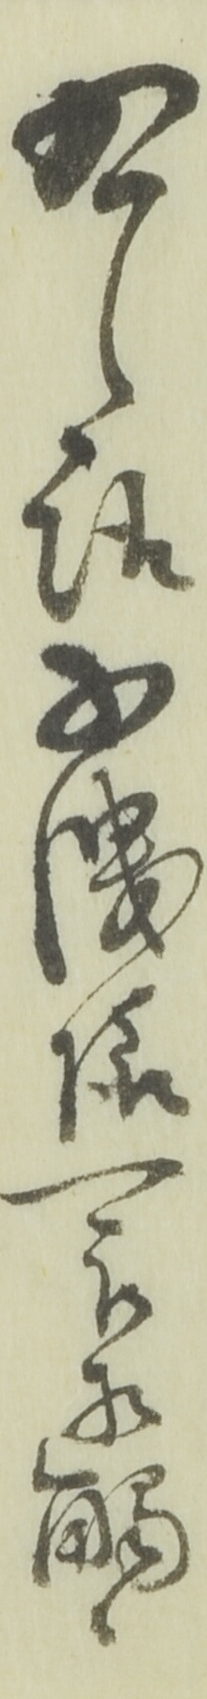右之趣不洩様可被相触候
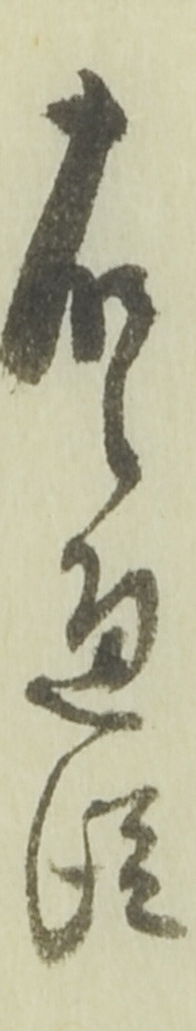右之通従
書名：御触書御書附控帳
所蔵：伊那市立高遠町図書館・合同会社AMANE
